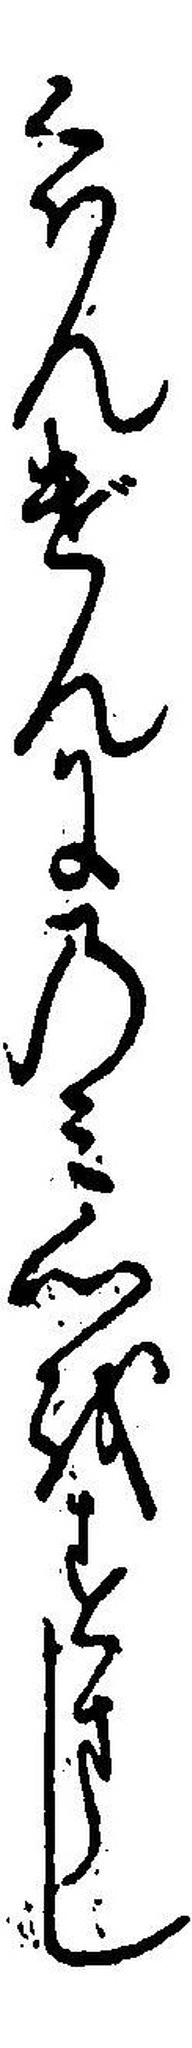くはんげんにのみ心をすまし
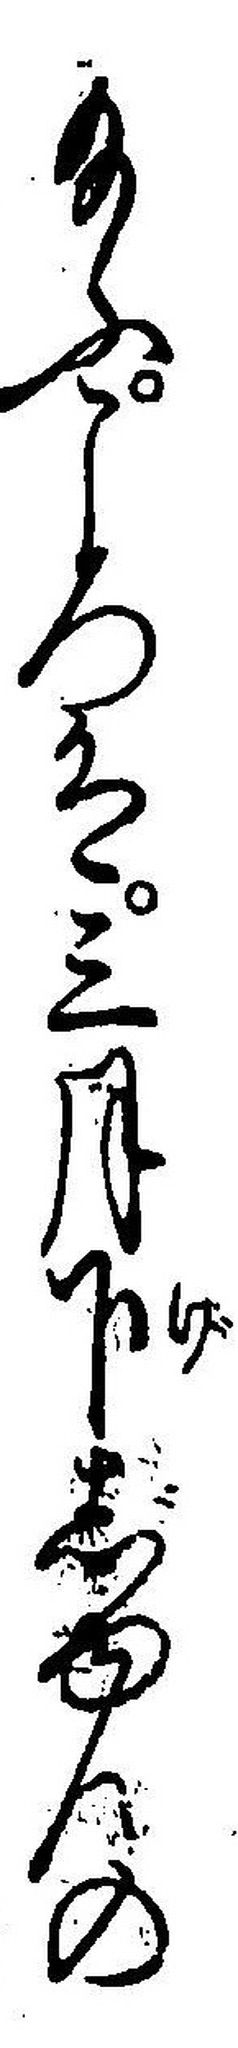給ふ。ころは。三月下じゆんの
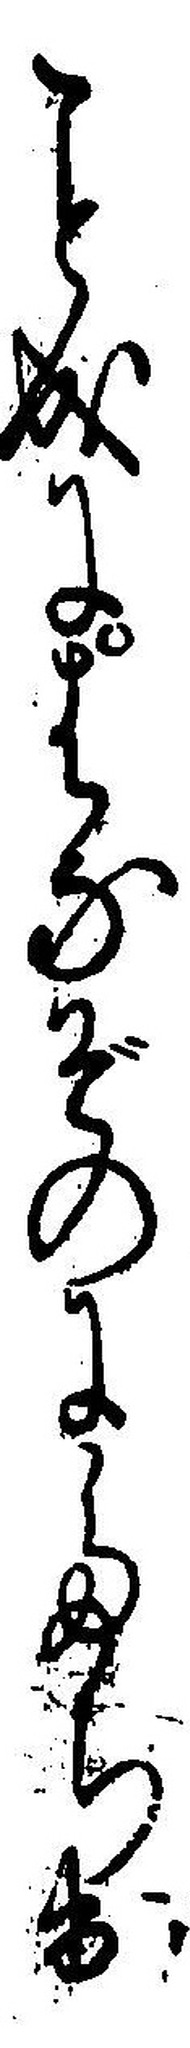こと成に。はなぞのにたち出
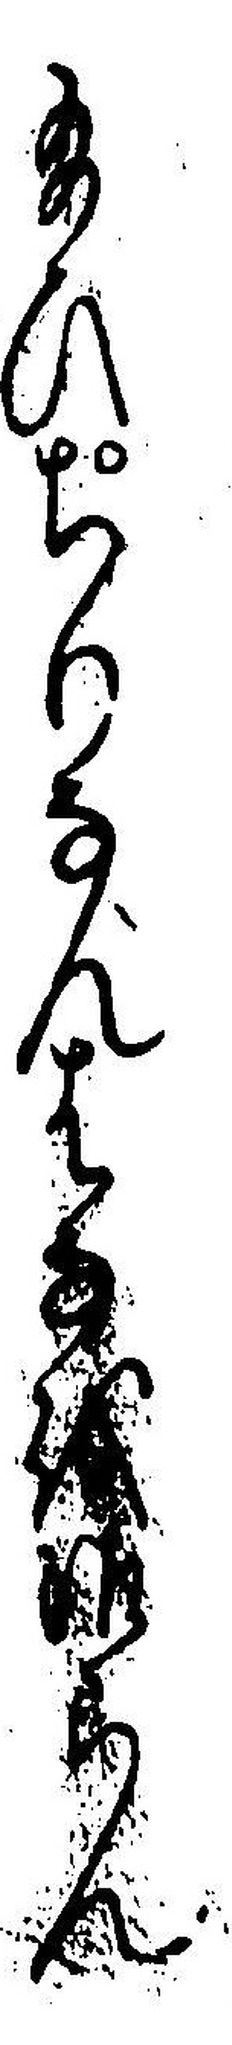給ひ。ちりなんはなを御らん
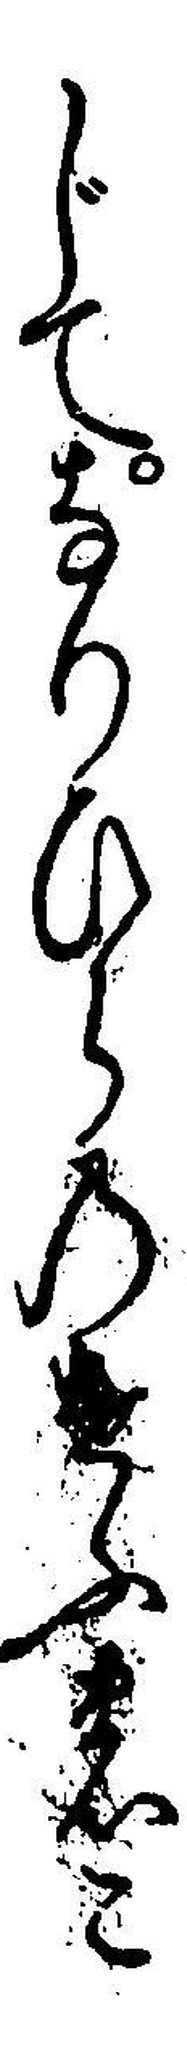じて。なりひらのけふのこ
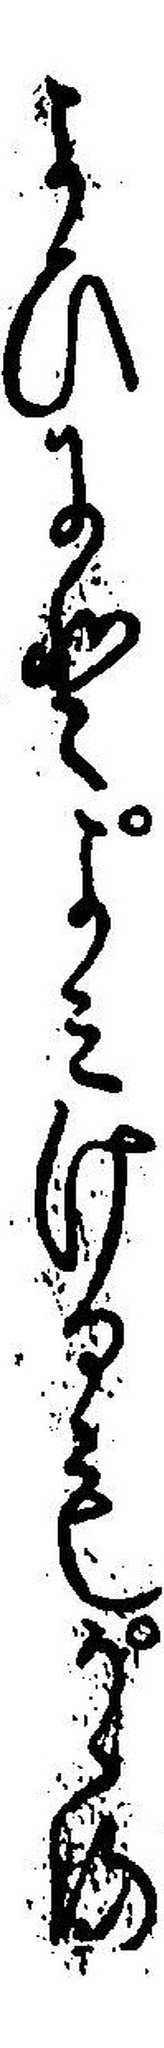よひにと。よみけるも。かゝる
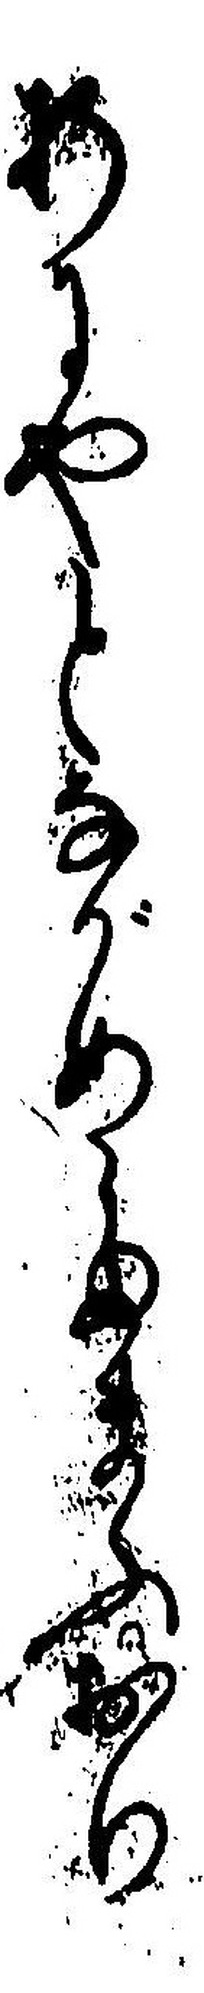折にやとながめたまふ。おり
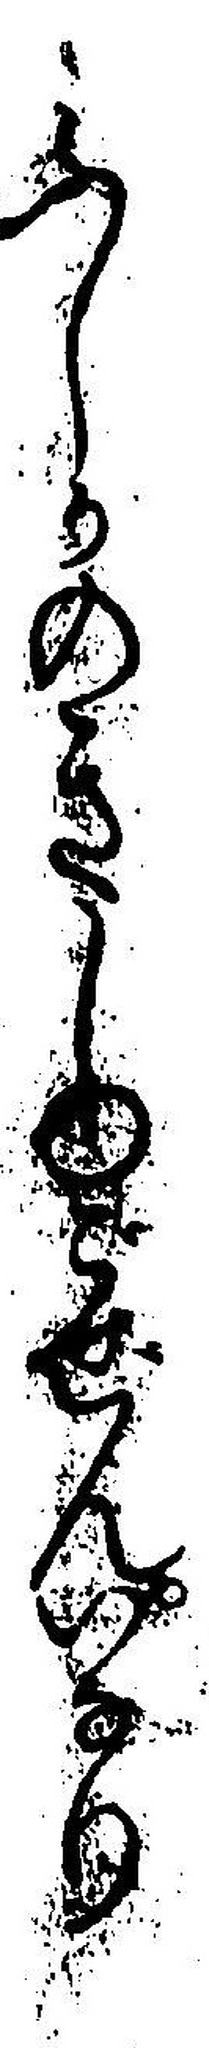ふしかのきしゆごぜん。いなり
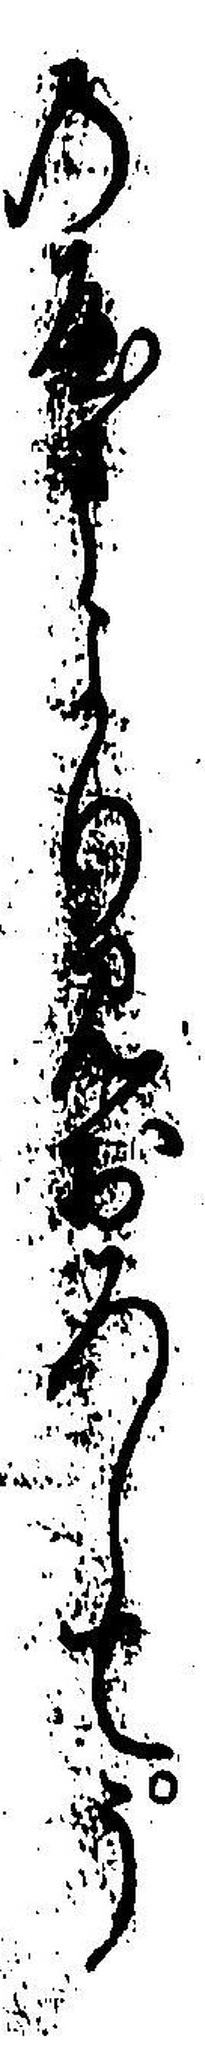のやまより見おろして。う

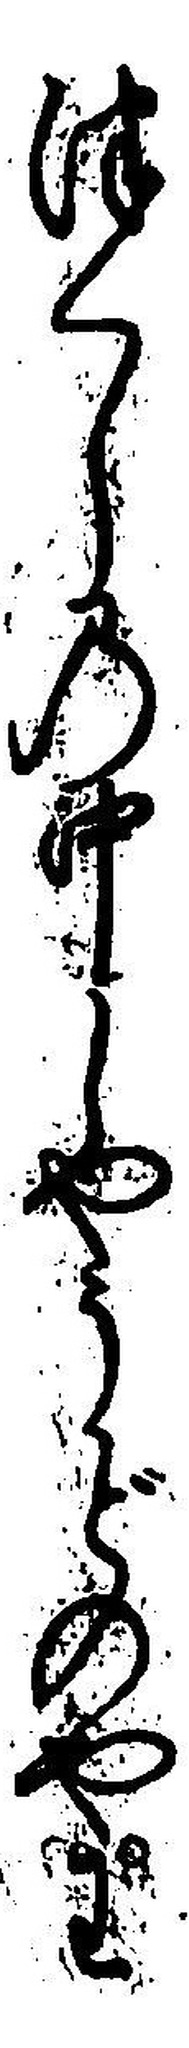つくしの中しやうどのや。わ
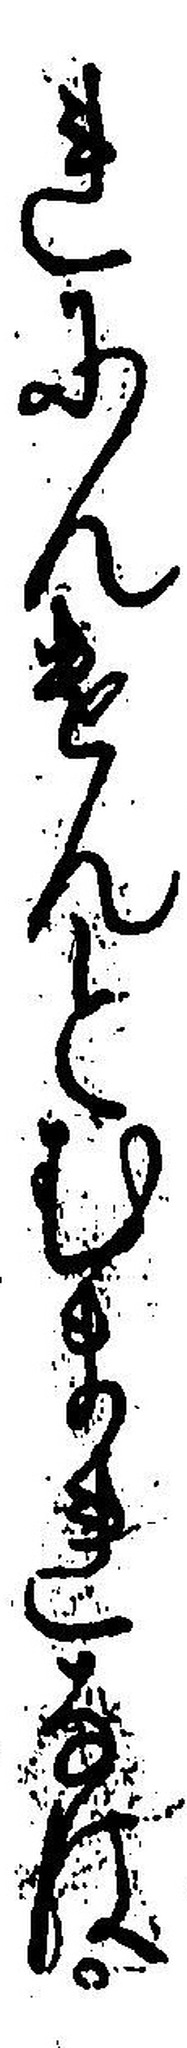れにんけんとむまれなは。
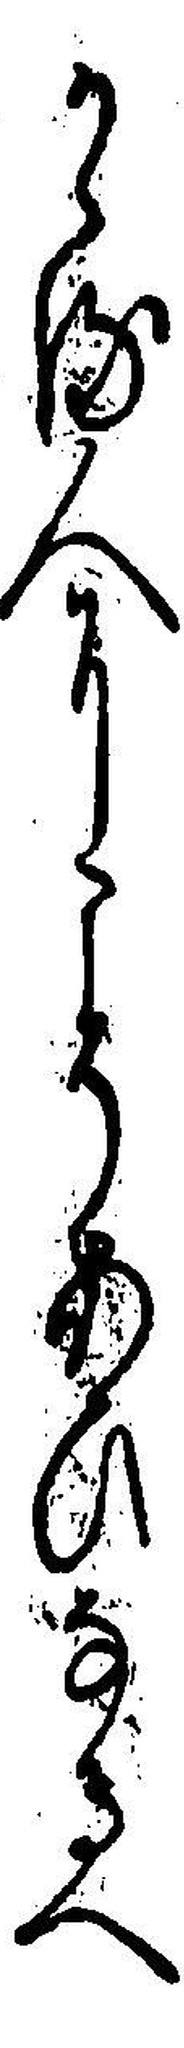かゝる人にこそあひなるへ
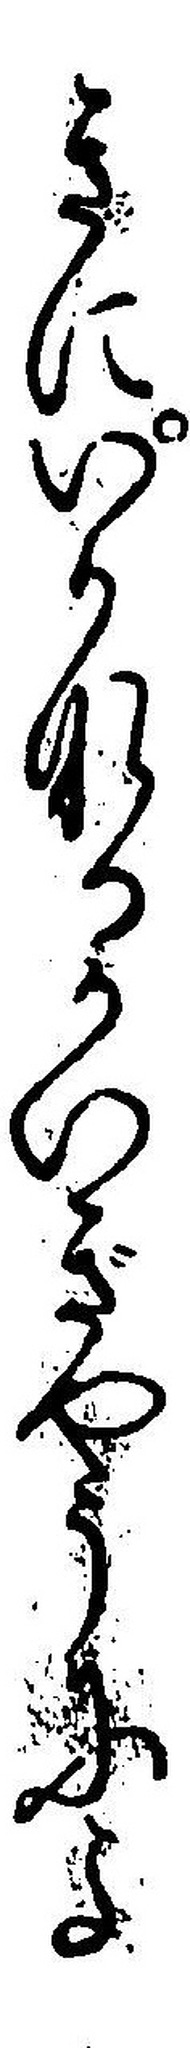きに。いかなるかいぎやうによ
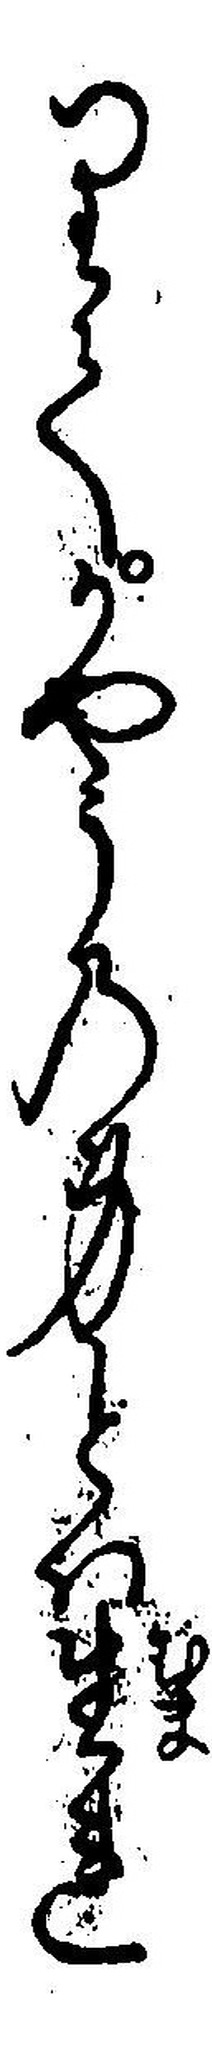りて。かやうの身とは生れ
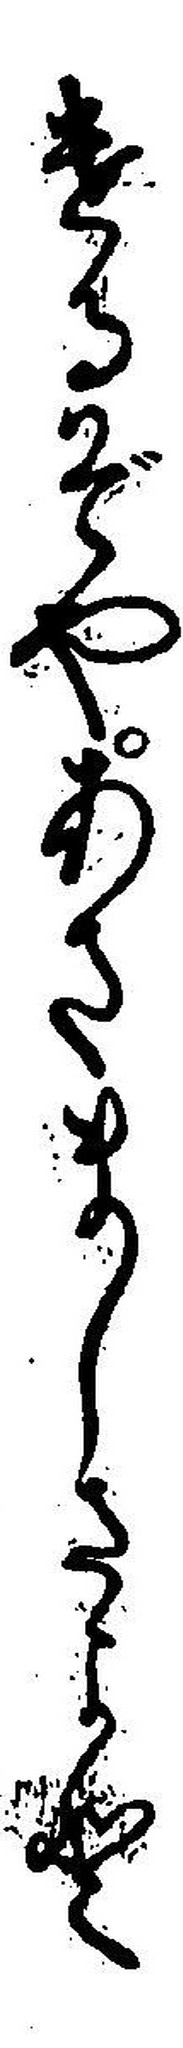けるぞや。あさましさよと
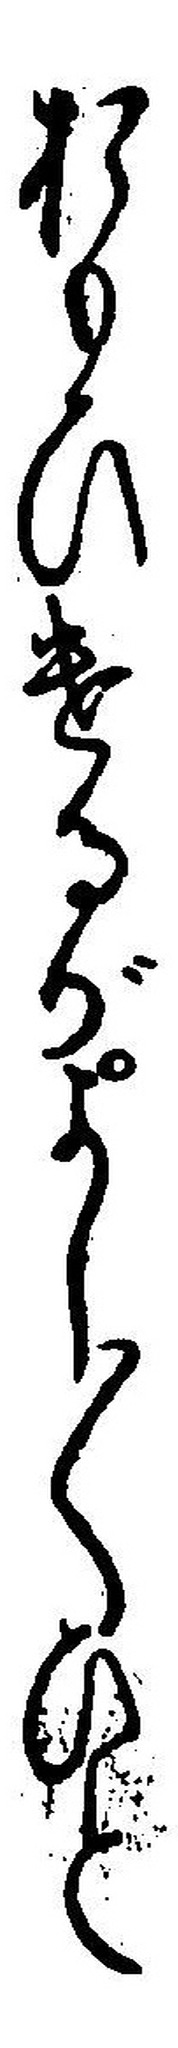おもひけるが。よし〳〵ひと
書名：木幡きつね
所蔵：東京大学総合図書館 General Library in the University of Tokyo, JAPAN
